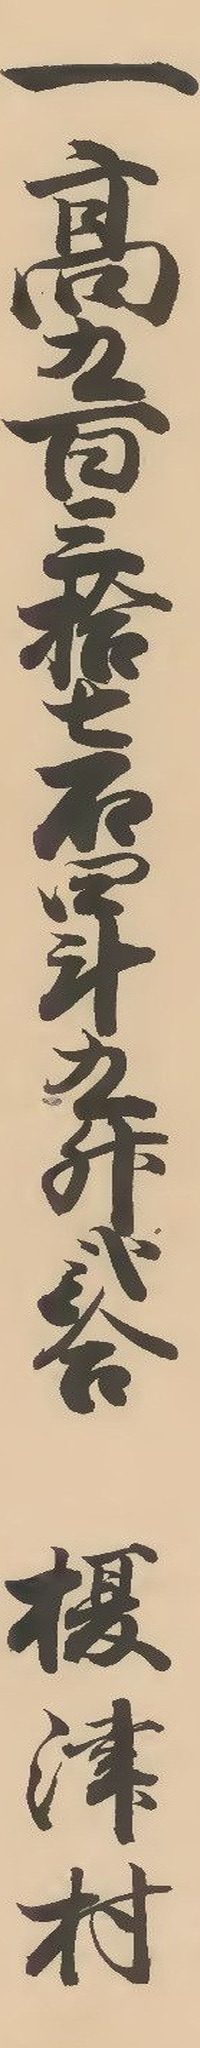一髙九百三拾七石四斗九升弐合榎津村

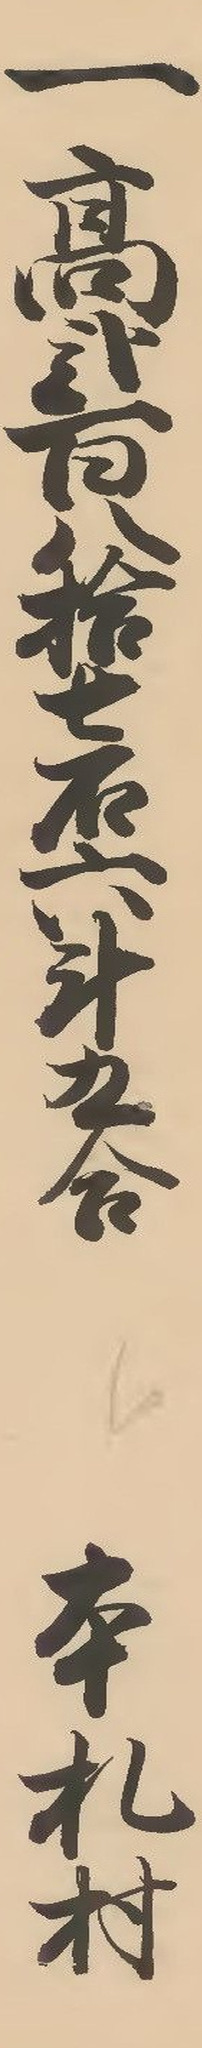一髙弐百八拾七石六斗九合本札村
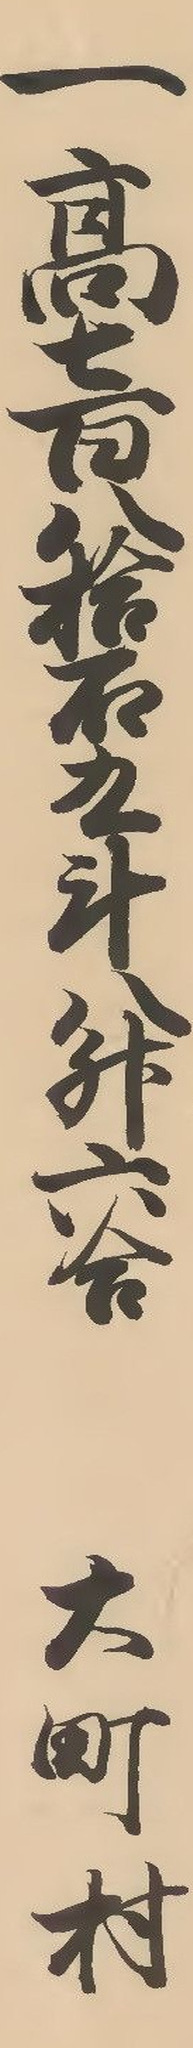一髙七百八拾石九斗八升六合大町村
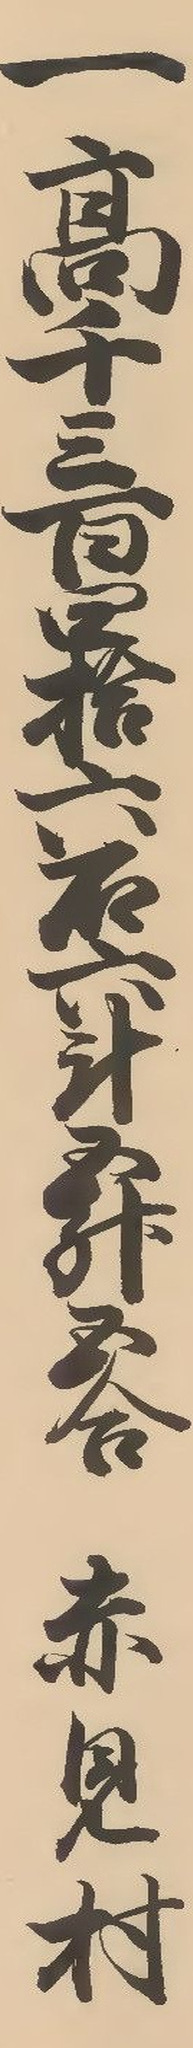一髙千三百四拾六石六斗五升五合赤見村
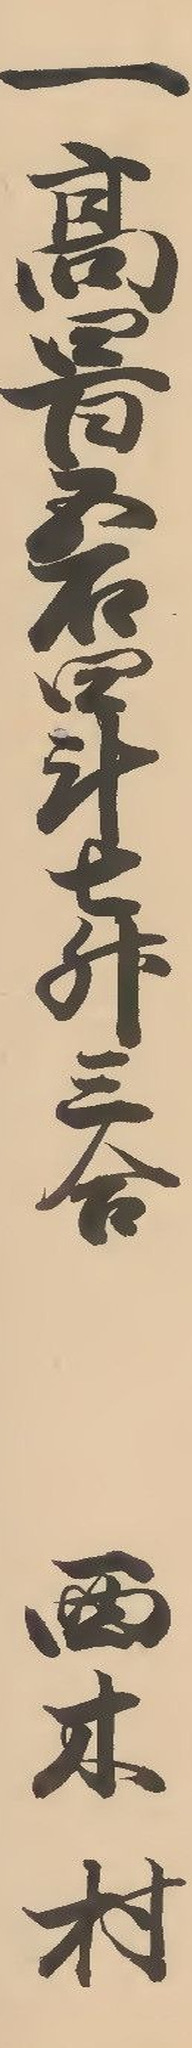一髙四百五石四斗七升三合西木村
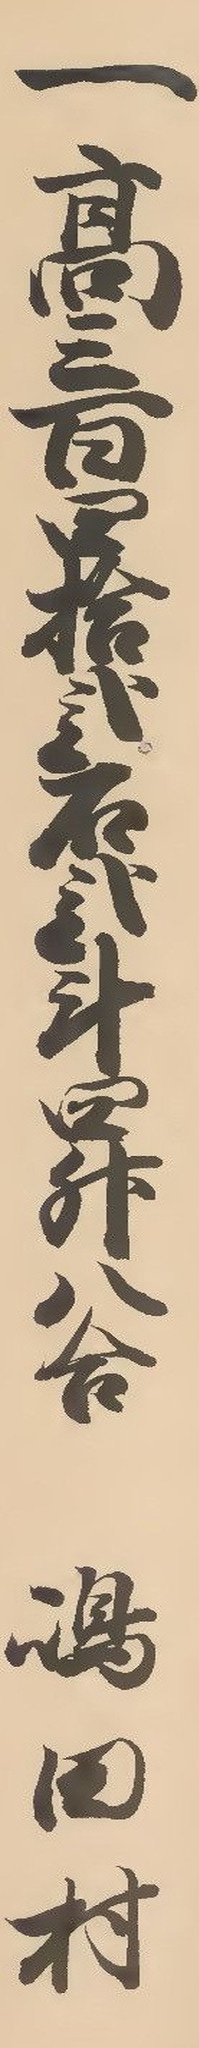一髙三百四拾弐石弐斗四升八合嶋田村
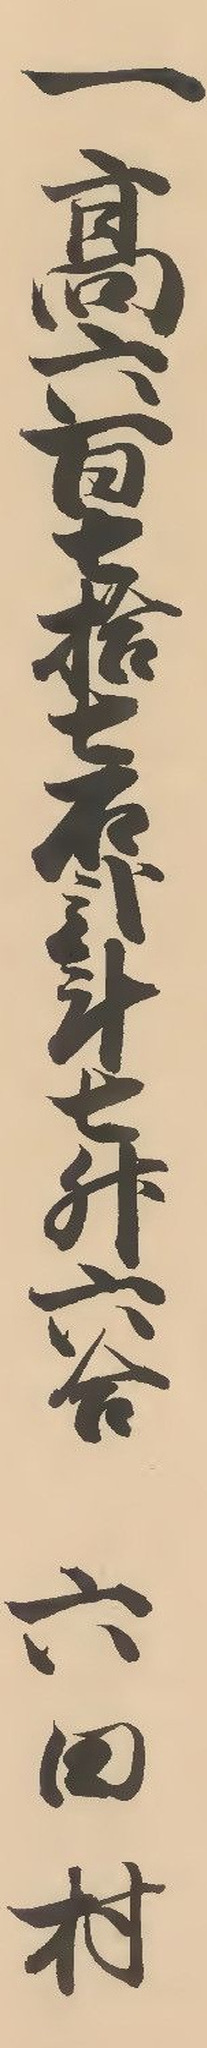一髙六百七拾七石弐斗七升六合六田村
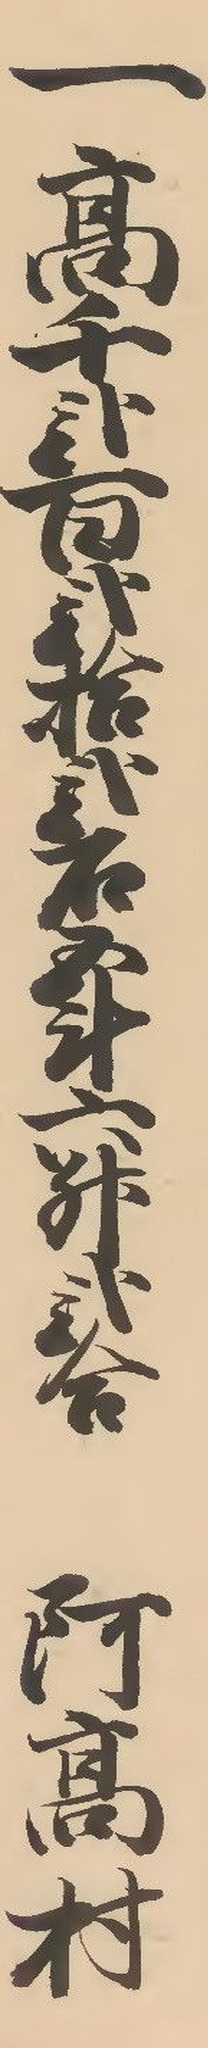一髙千弐百弐拾弐石五斗六升弐合阿髙村
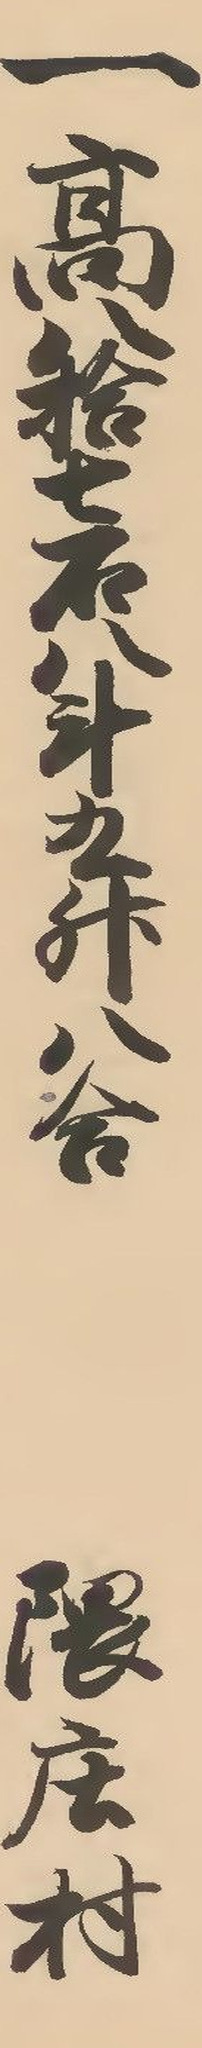一髙八拾七石八斗九升八合隈庄村

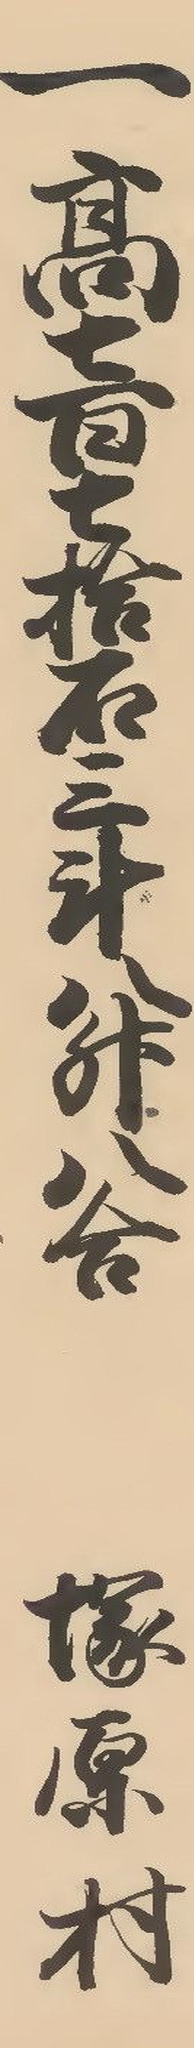一髙七百七拾石三斗八升八合塚原村
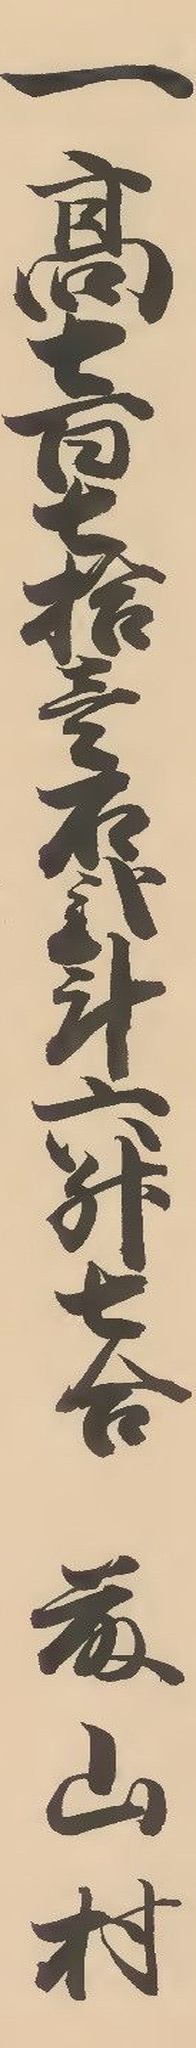一髙七百七拾壱石弐斗六升七合藤山村
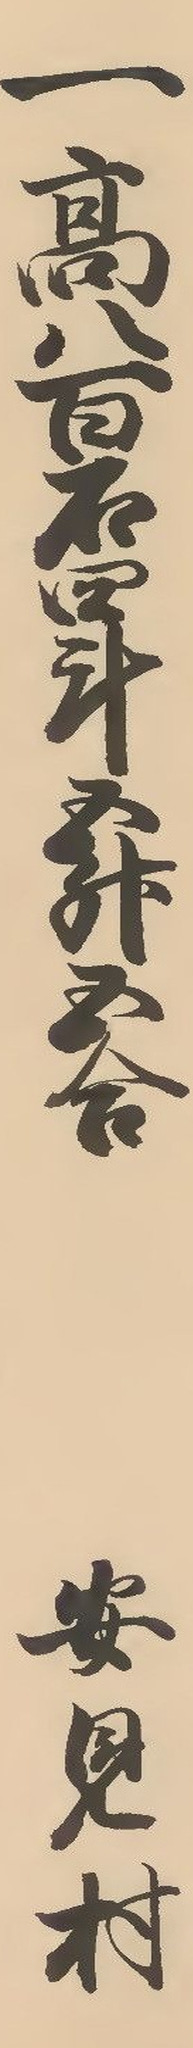一髙八百石四斗五升五合安見村
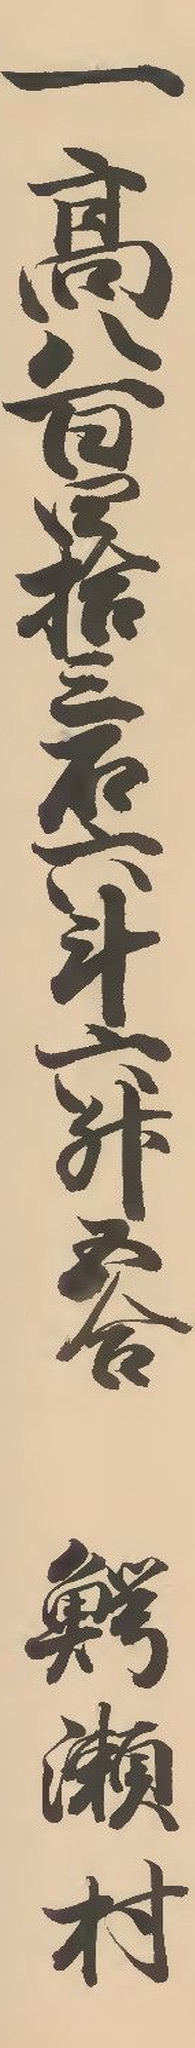一髙八百四拾三石六斗六升五合鰐瀬村
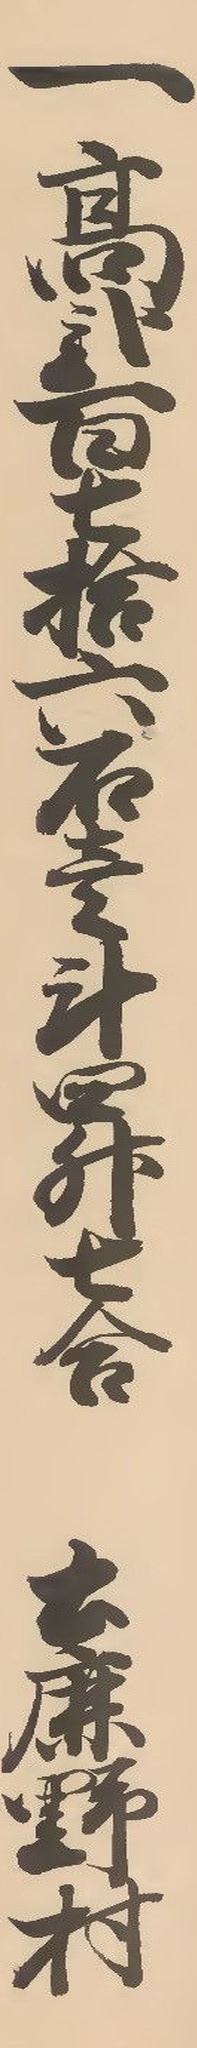一髙弐百七拾六石壱斗四升七合土鹿野村
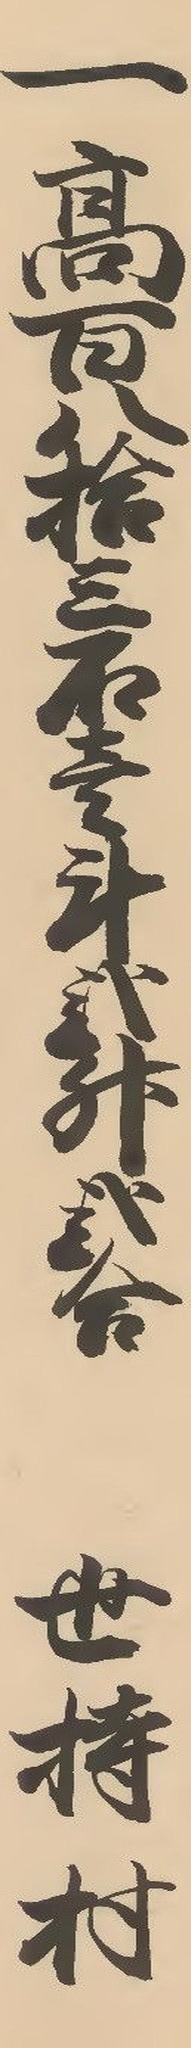一髙百八拾三石壱斗弐升弐合世持村
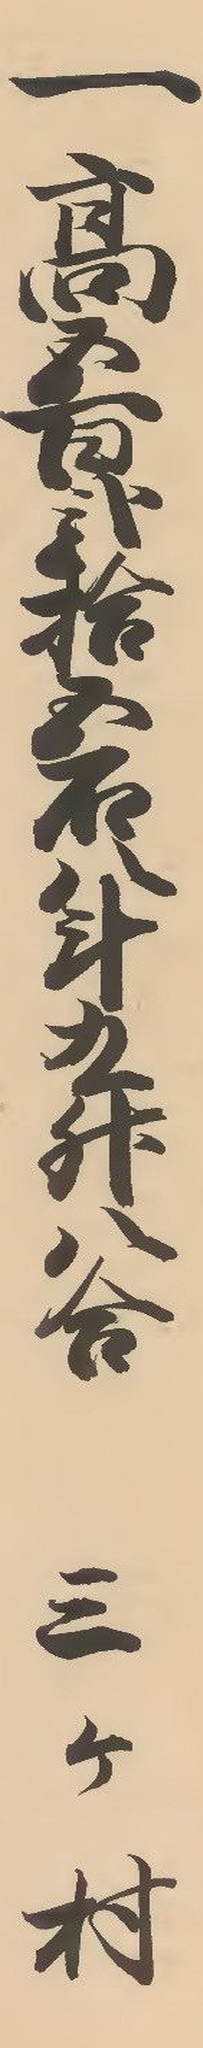一髙五百弐拾五石八斗九升八合三ケ村
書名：肥後国郷帳
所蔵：国立公文書館 National Archives of Japan
